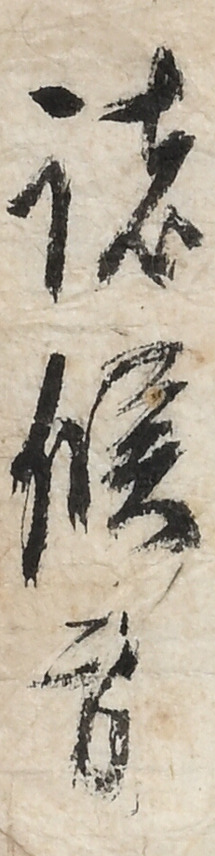諸侯方

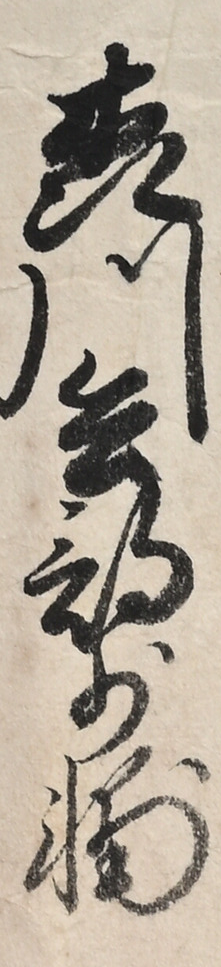森川兵部少輔
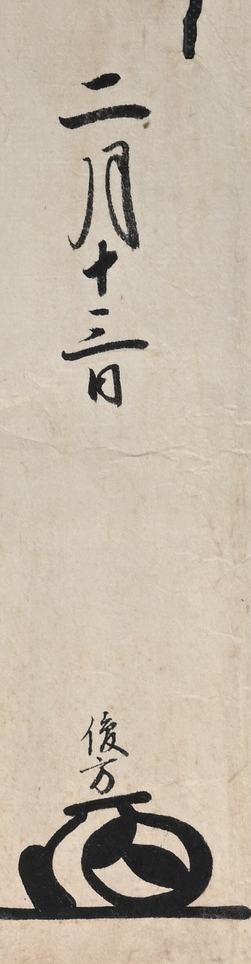二月十三日俊方
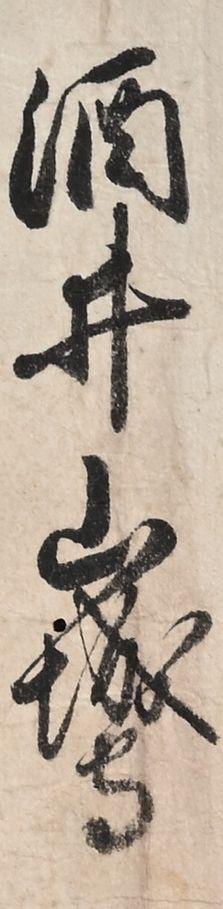酒井山城守

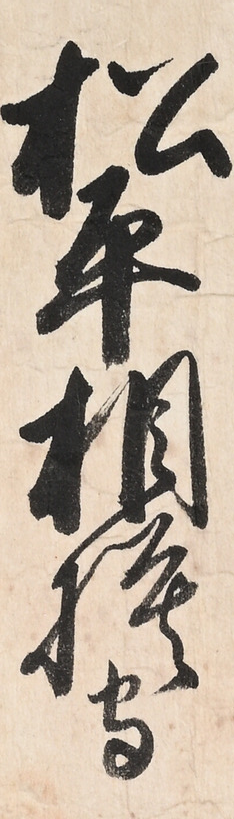松平相模守

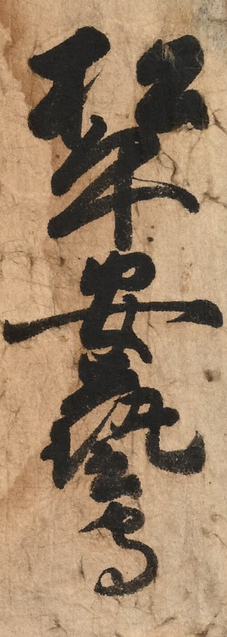松平安芸守
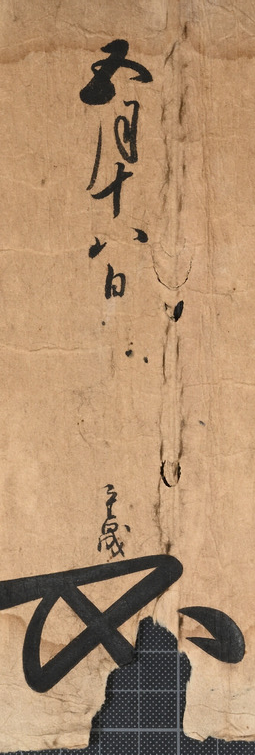五月十八日重晟
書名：諸侯方花押
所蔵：伊那市立高遠町図書館・合同会社AMANE
